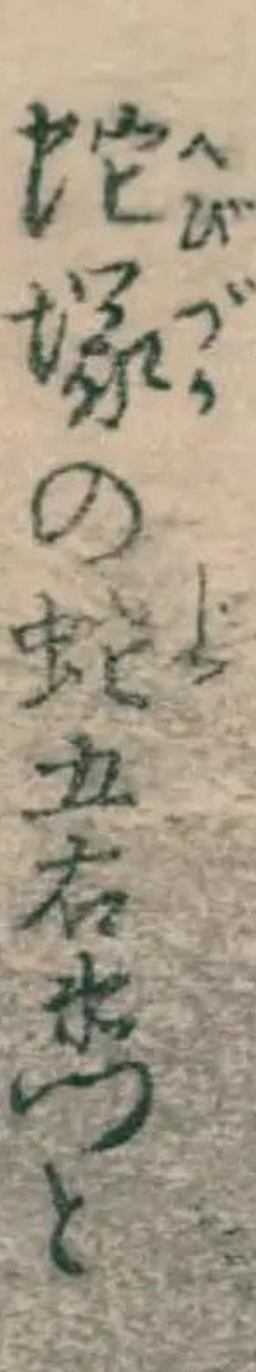蛇塚の蛇五右衛門と
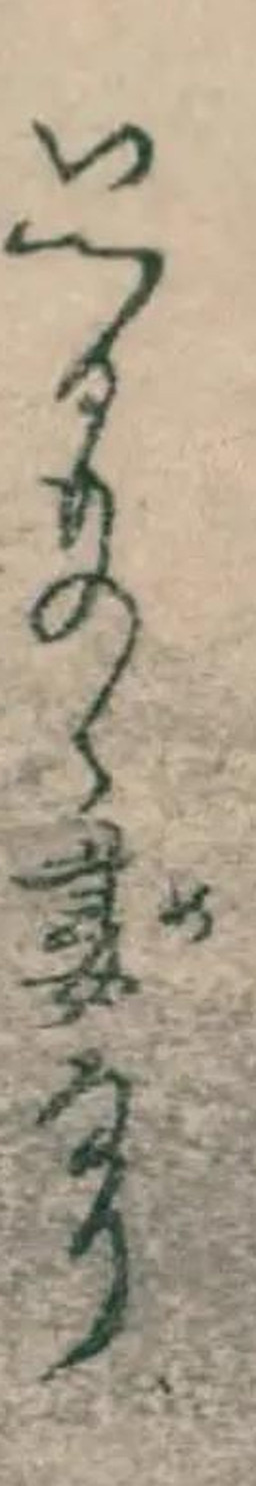いへるものゝ妻なり
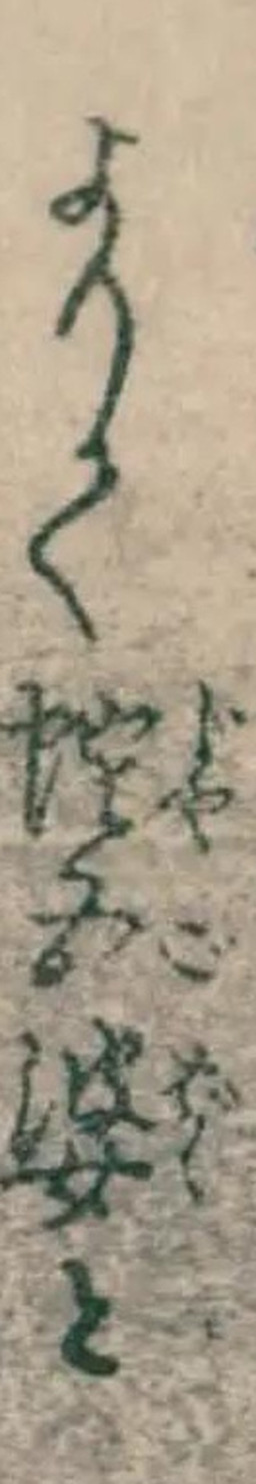よりて蛇五婆と
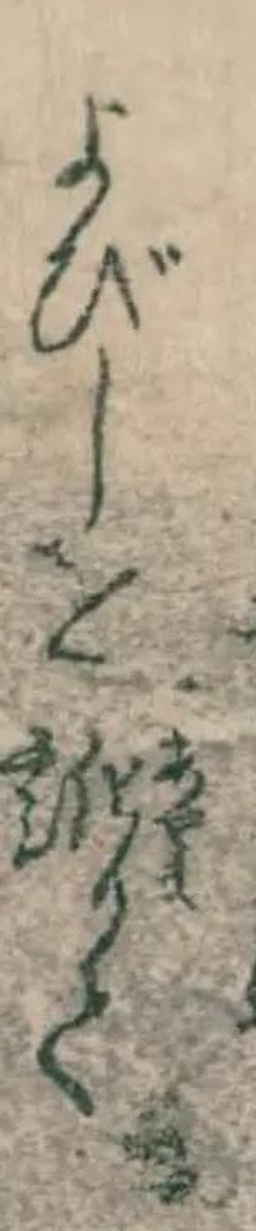よびしを訛りて
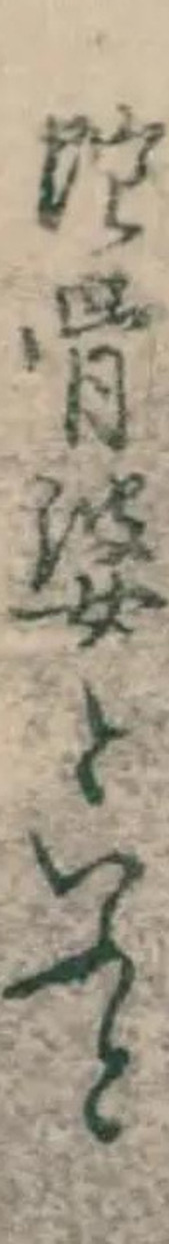蛇骨婆といふと

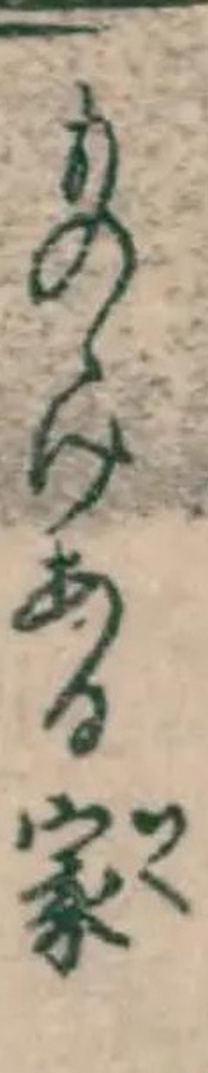ものゝけある家
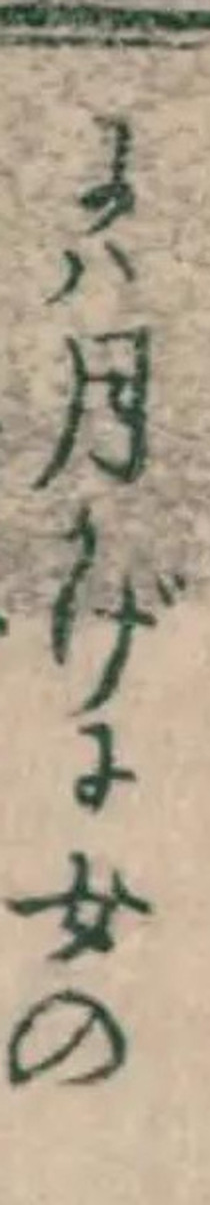には月かげに女の
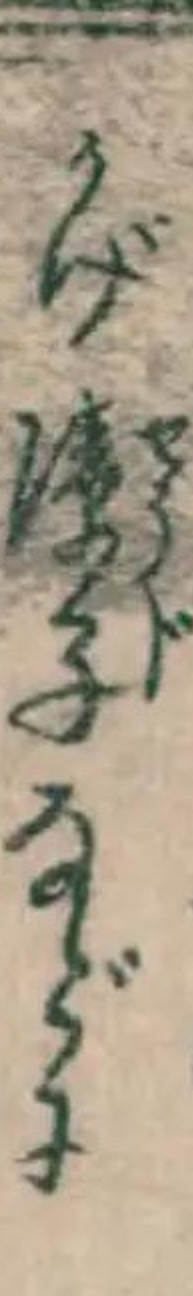かげ障子などに
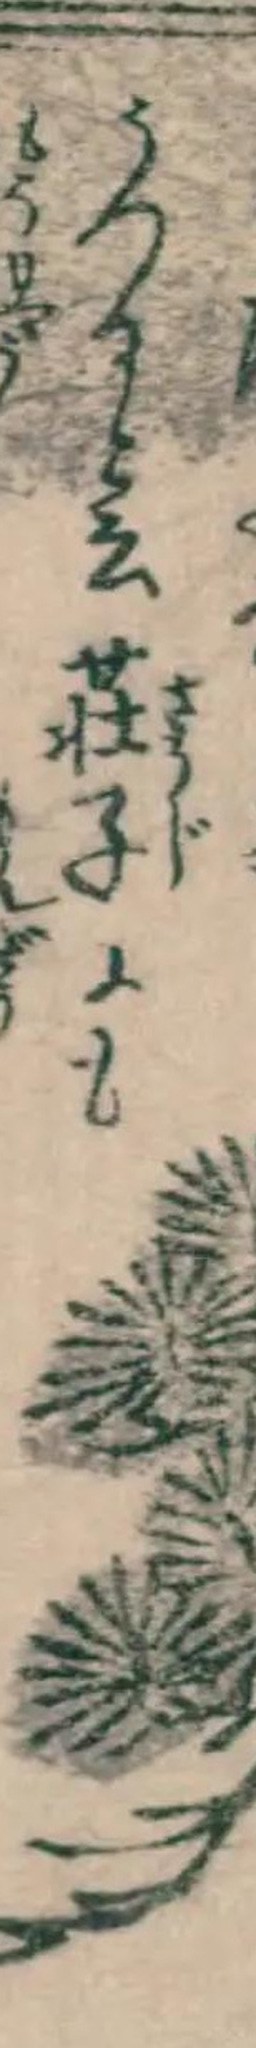うつると云荘子にも
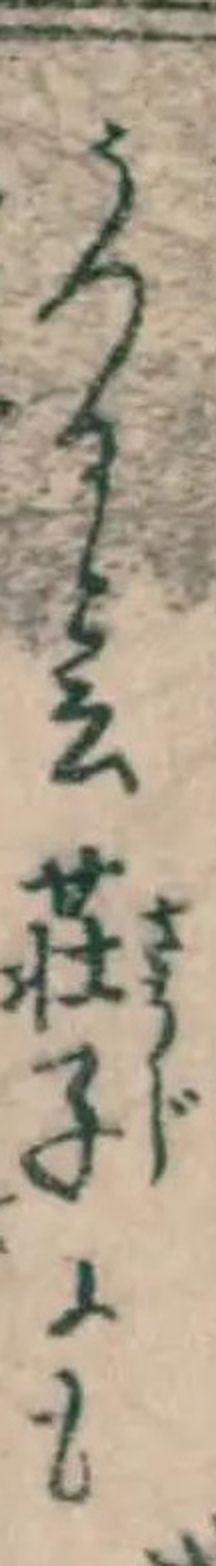うつると云荘子にも
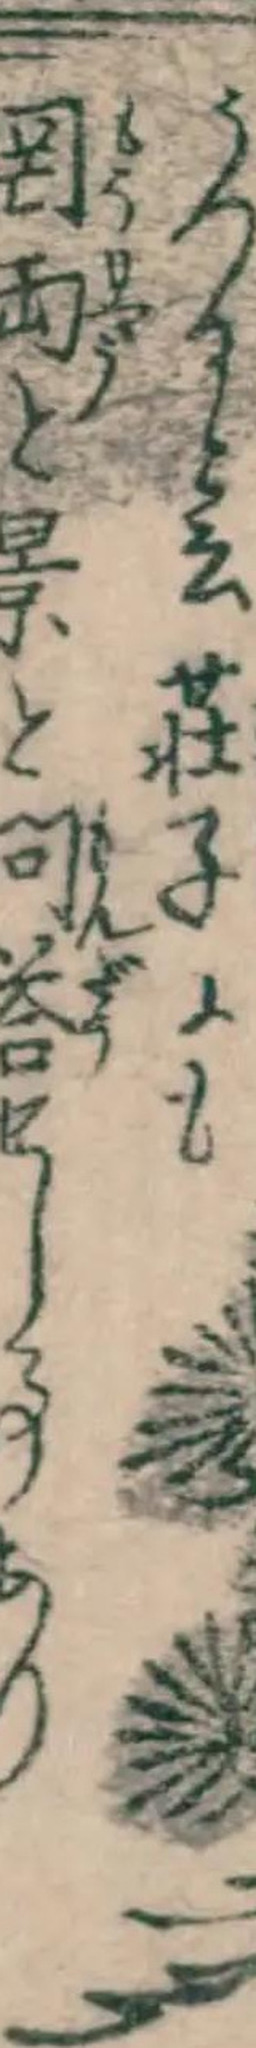罔両と景と問答せし事あり
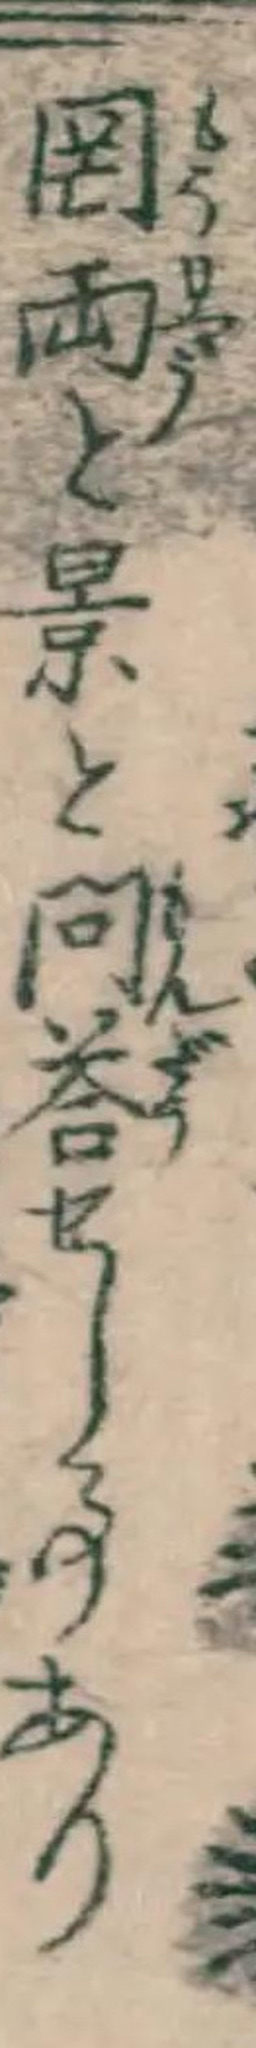罔両と景と問答せし事あり
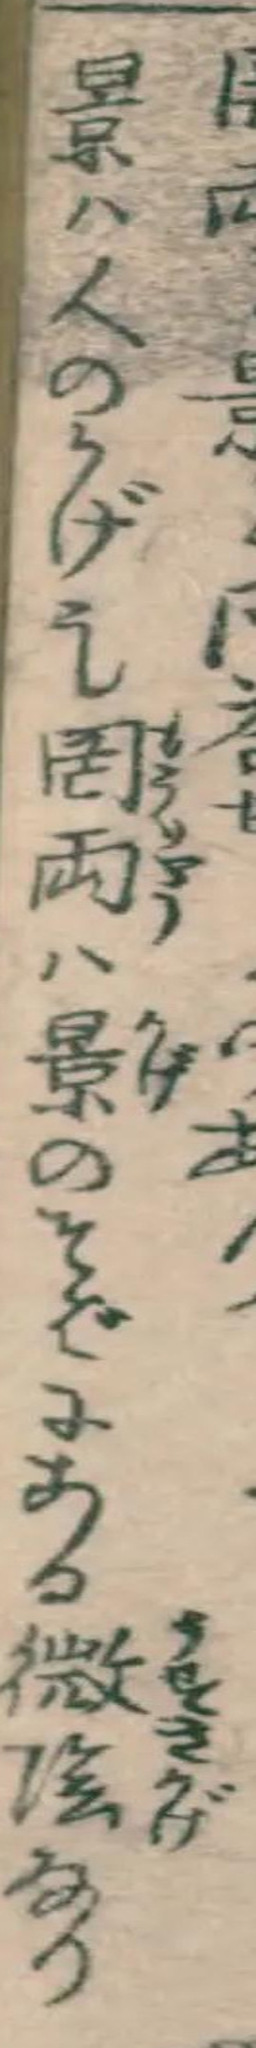景は人のかげ也罔両は景のそばにある微陰なり
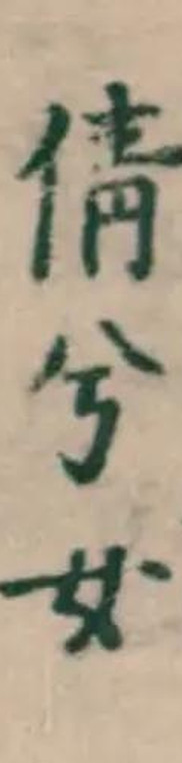倩兮女
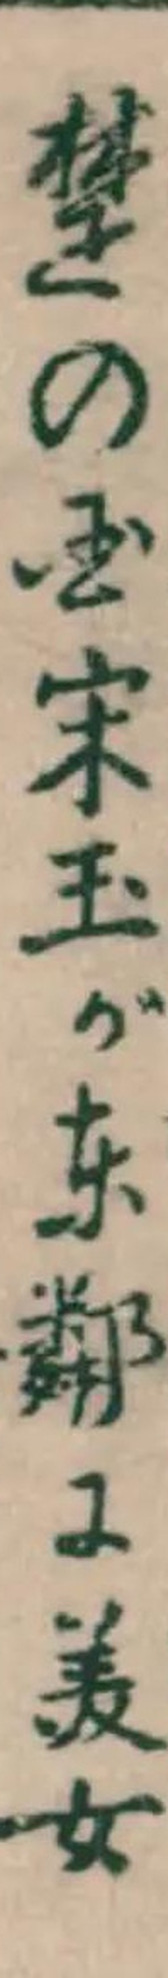楚の国宋玉が東隣に美女
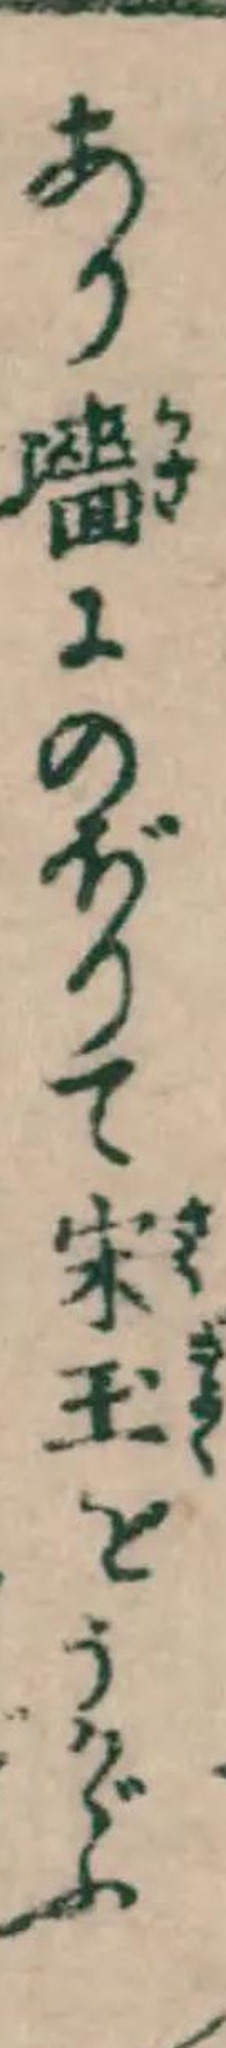あり墻にのぼり宋玉をうかゞふ
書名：百鬼夜行 3巻拾遺3巻. [2]
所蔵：国立国会図書館 National Diet Library, JAPAN
